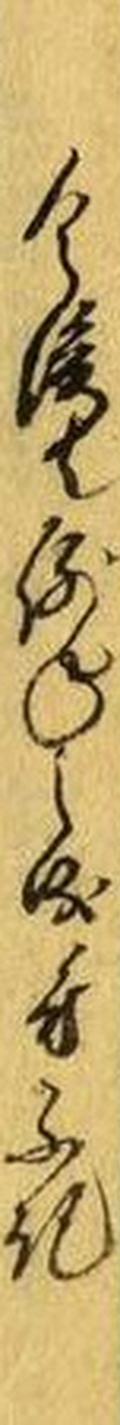今後は例年之儀に付不記
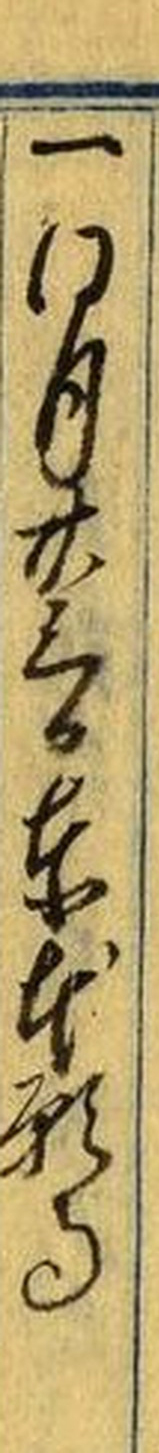一同月廿三日東本願寺
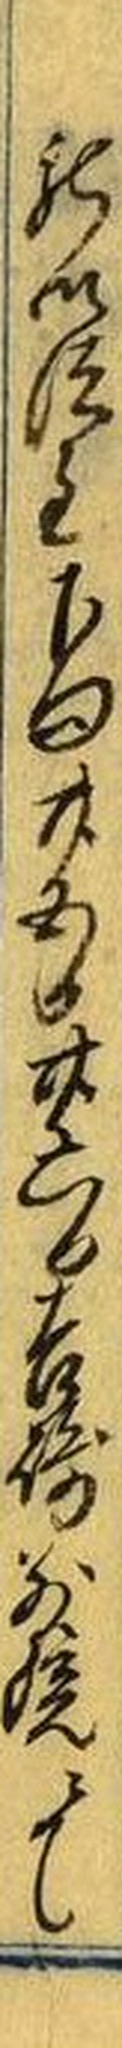新御法主下向廿五日廿六日吉崎別院にて
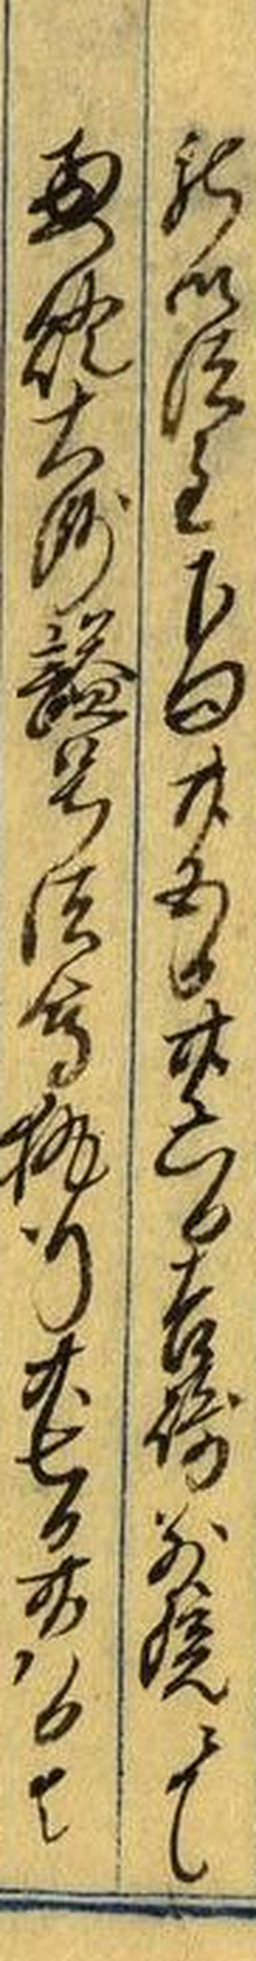恵燈大師諡号法会執行廿七日廿八日は
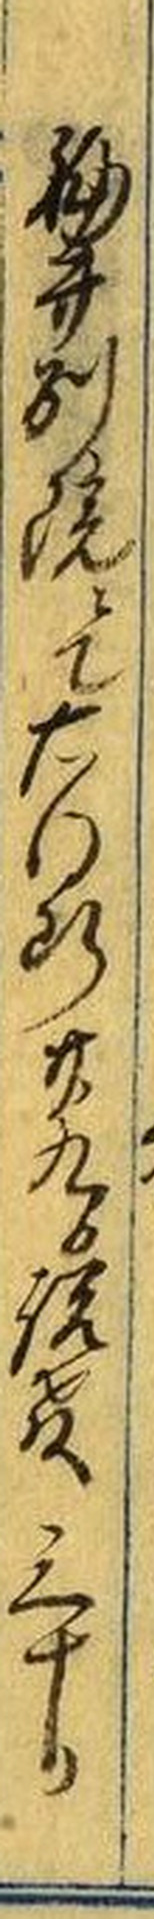福井別院にて右同断廿九日説教三十日

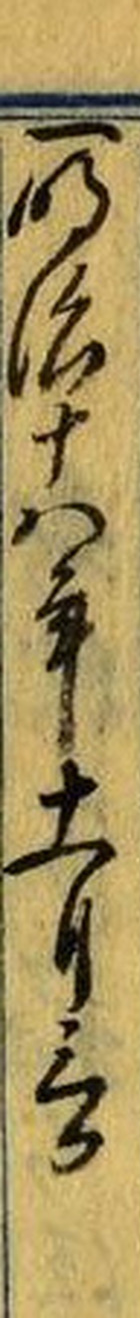一明治十八年十一月三日
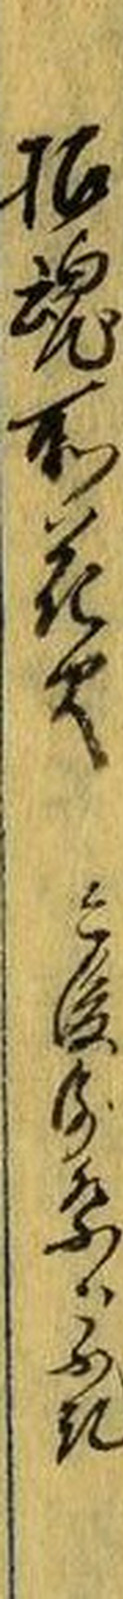招魂所花火今後例祭は不記
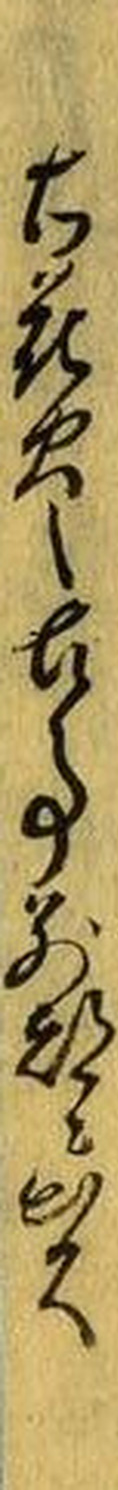右花火之古事別部に出ス
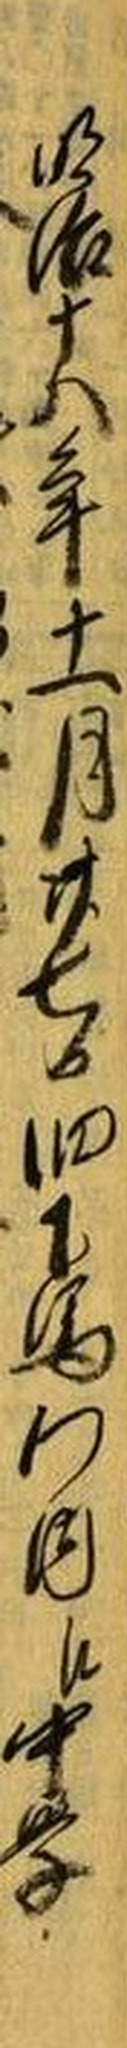明治十八年十一月廿七日旧下馬門内え中学
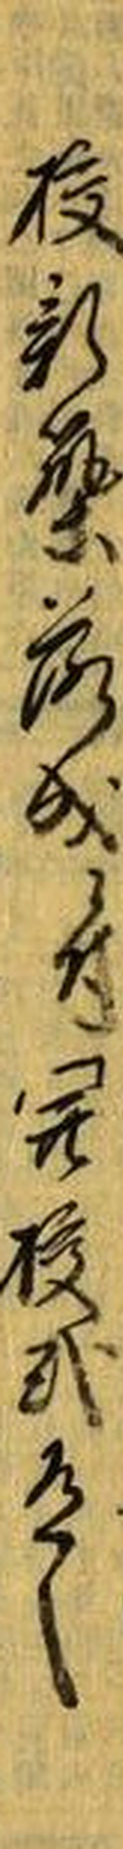校新築落成に付開校式有之
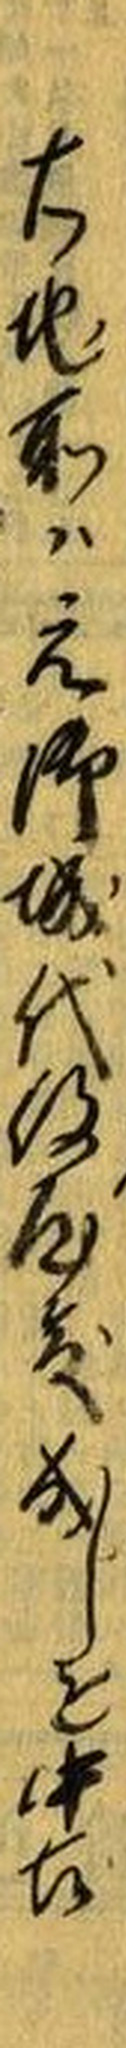右地所は元御城代役屋敷成しを中古
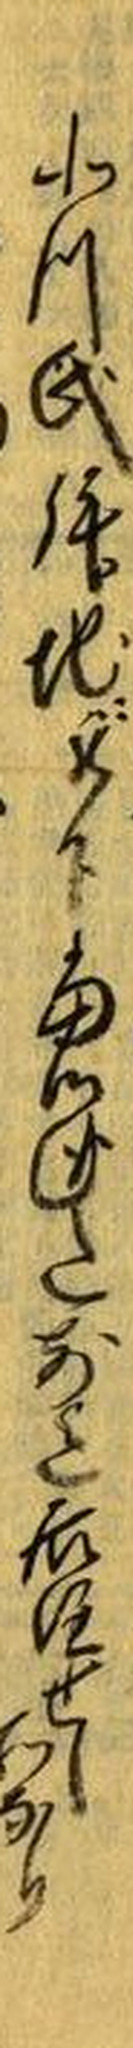北川氏拝地に被下当御趣意前迄居住せし所なり
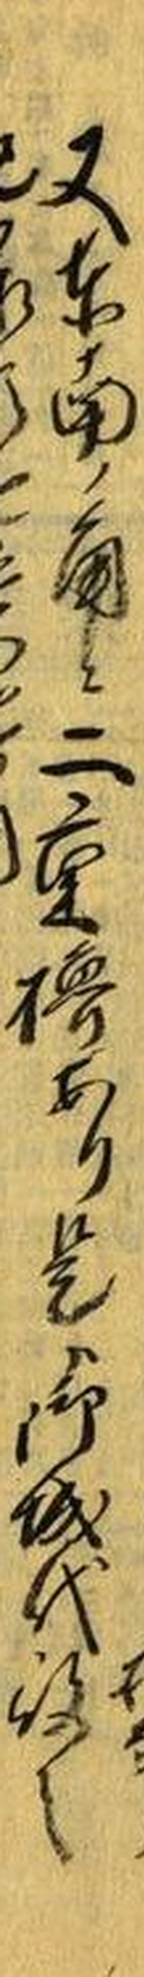又東南の角に二重櫓あり是は御城代役之
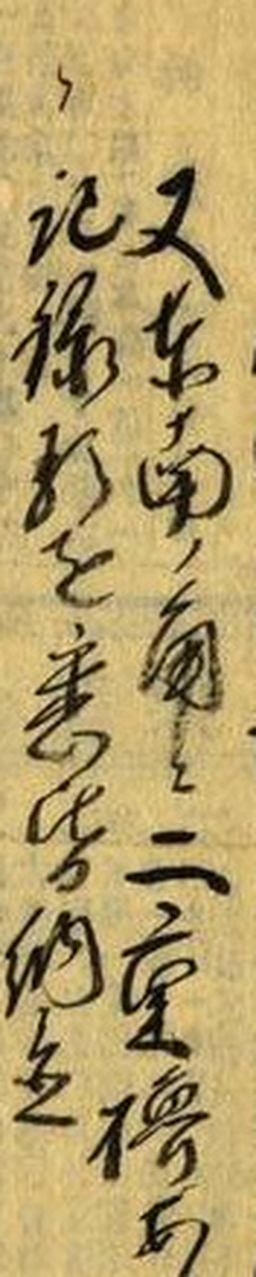記録類を悉皆納置
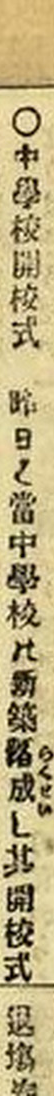〇中学校開校式昨日は当中学校の新築落成し其開校式
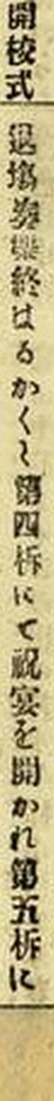退場奏楽終はるかくて第四柝にて祝宴を開かれ第御柝に
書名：温古集 五巻
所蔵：福井県文書館 Fukui Prefectural Archives
